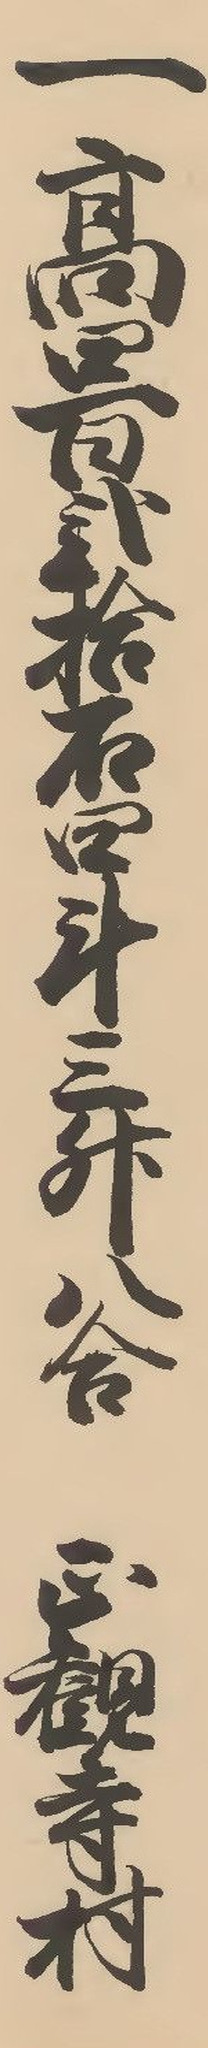一髙四百弐拾石四斗三升八合正観寺村
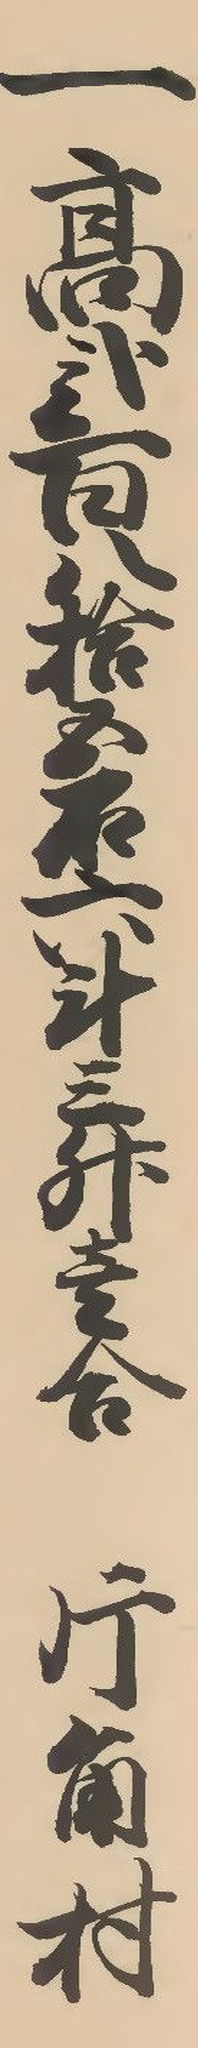一髙弐百八拾五石六斗三升壱合片角村
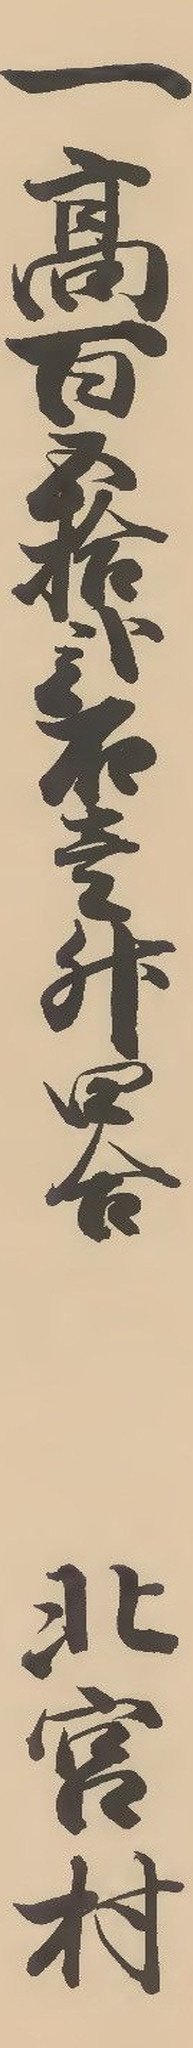一髙百五拾弐石壱升四合北宮村
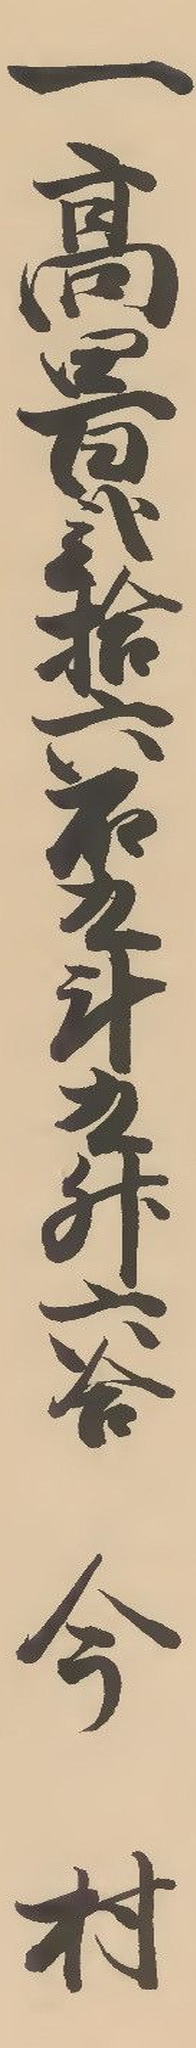一髙四百弐拾六石九斗九升六合今村
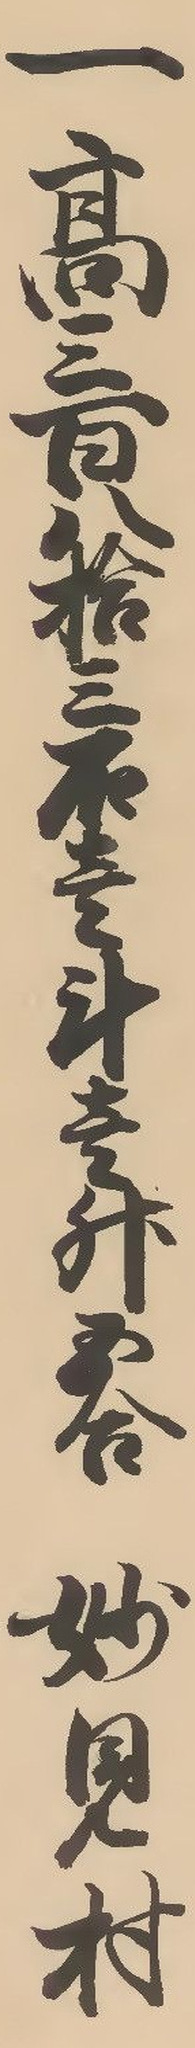一髙三百八拾三石壱斗壱升五合妙見村

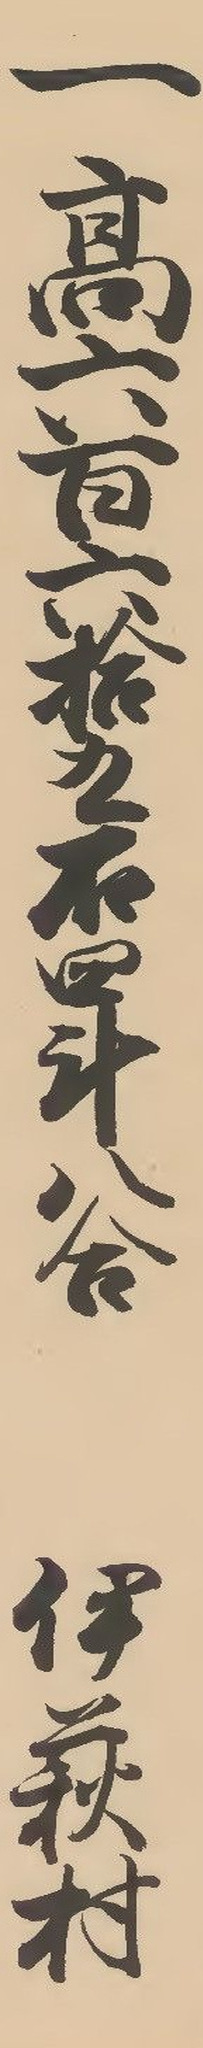一髙六百六拾九石四斗八合伊萩村
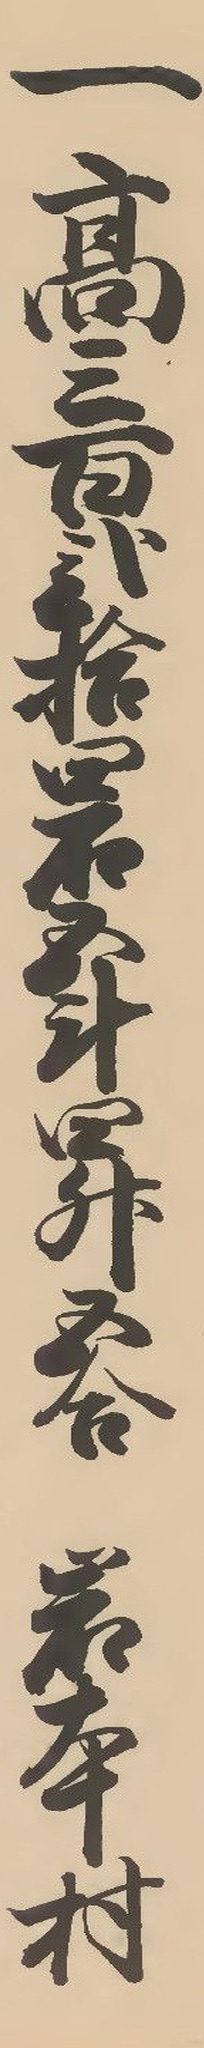一髙三百弐拾四石五斗四升五合岩本村
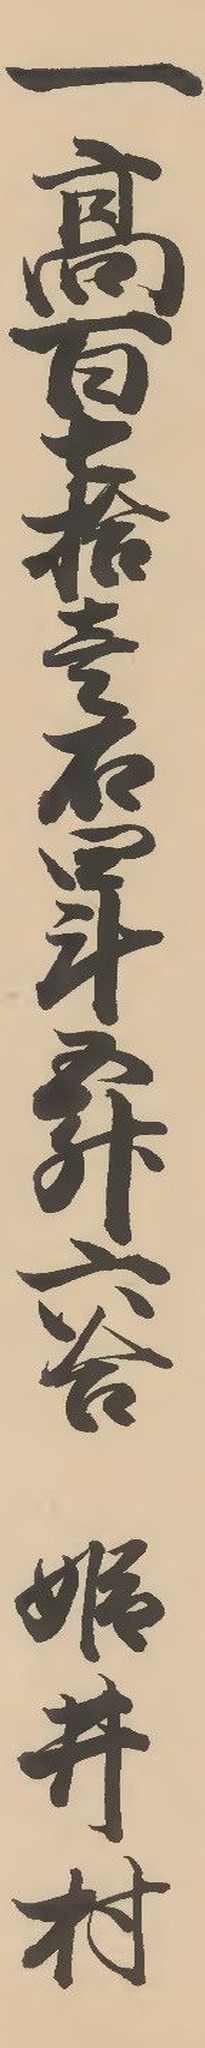一髙百七拾壱石四斗五升六合姫井村
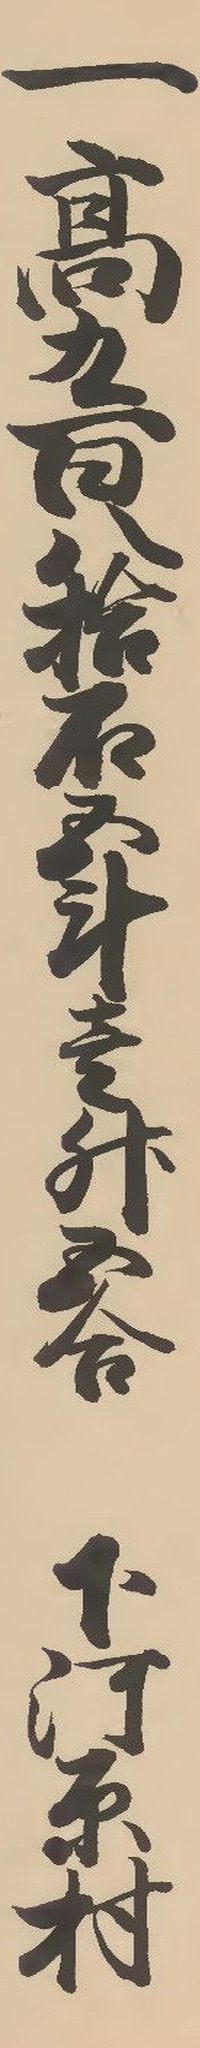一髙九百八拾石五斗壱升五合下河原村
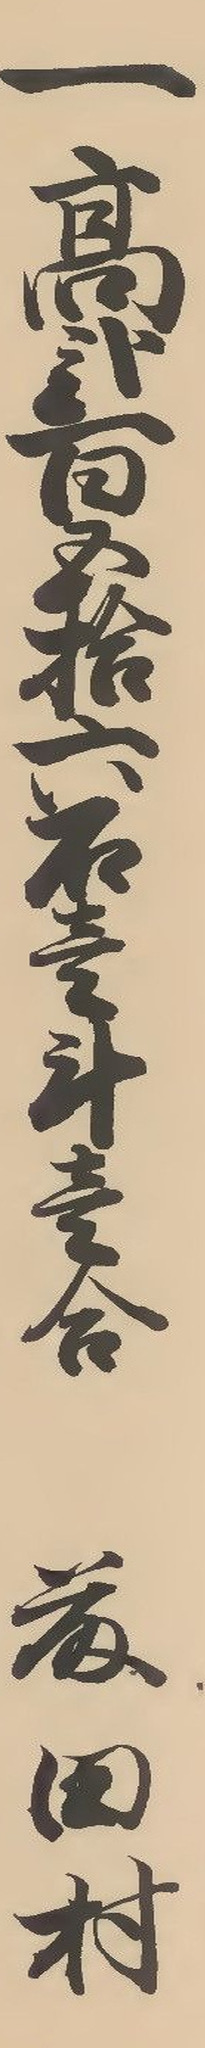一髙弐百五拾六石壱斗壱合藤田村
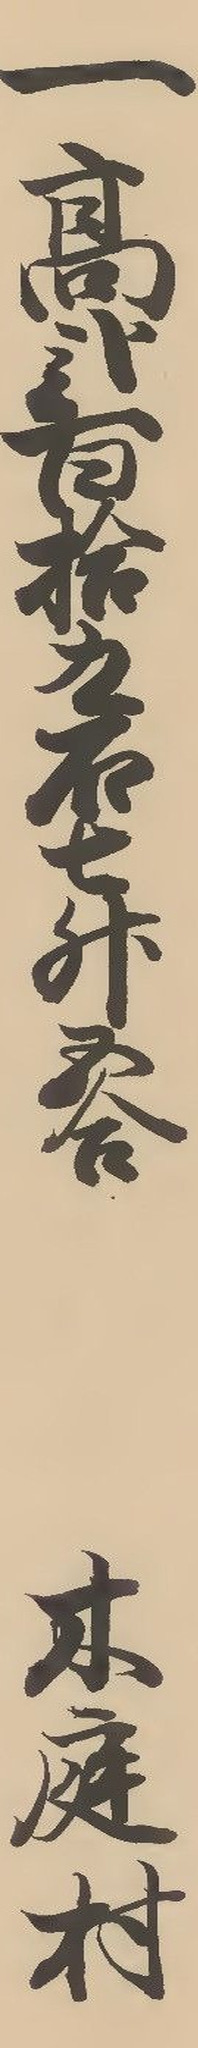一髙弐百拾九石七升五合木庭村
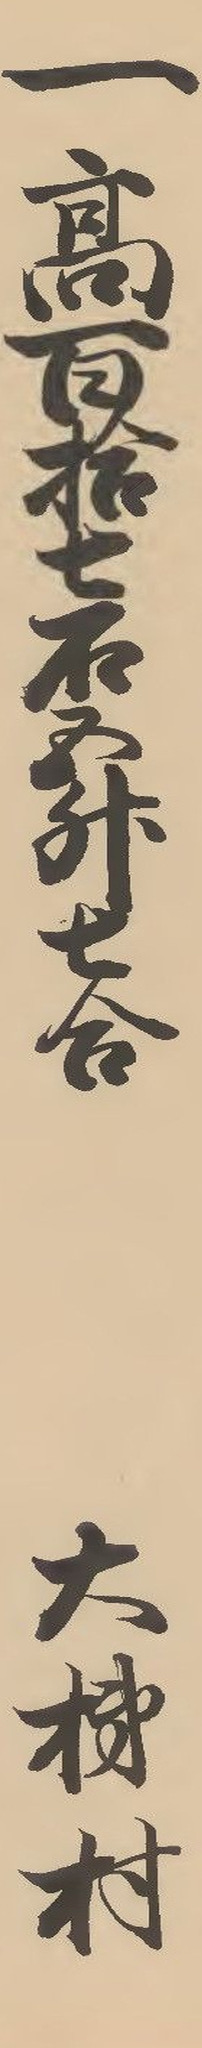一髙百拾七石五升七合大柿村
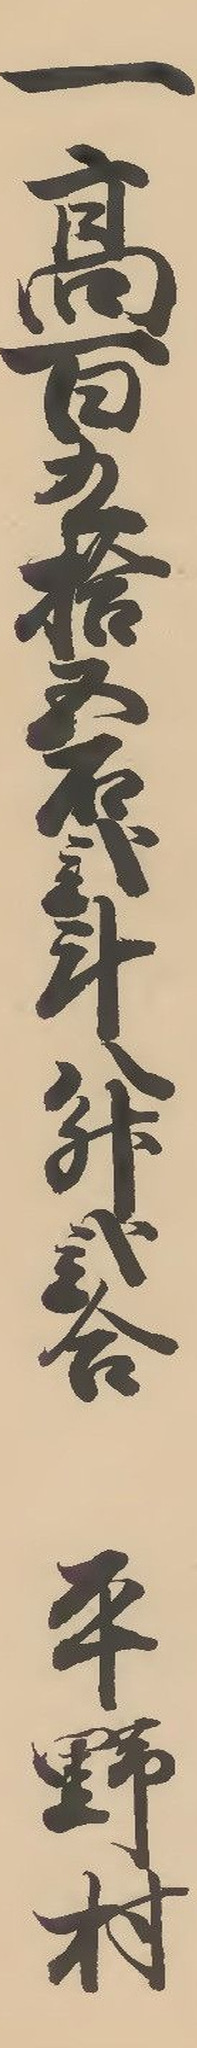一髙百九拾五石弐斗八升弐合平野村

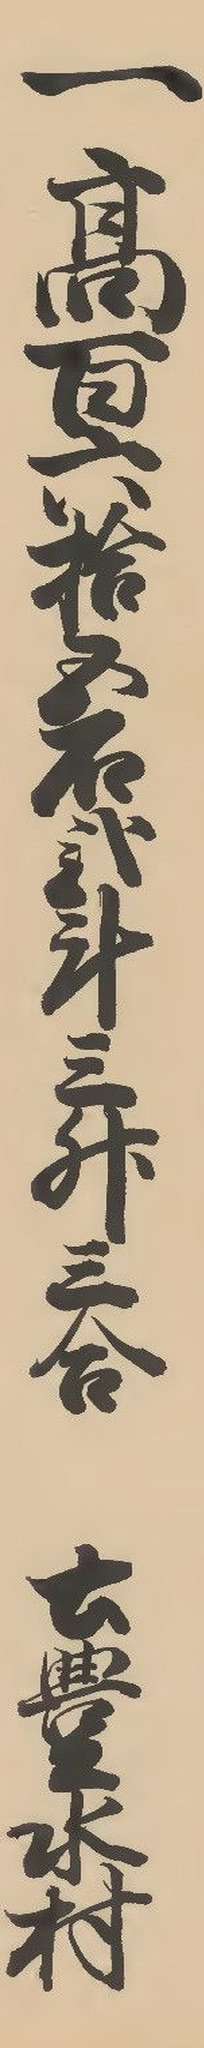一髙百六拾五石弐斗三升三合土豊水村
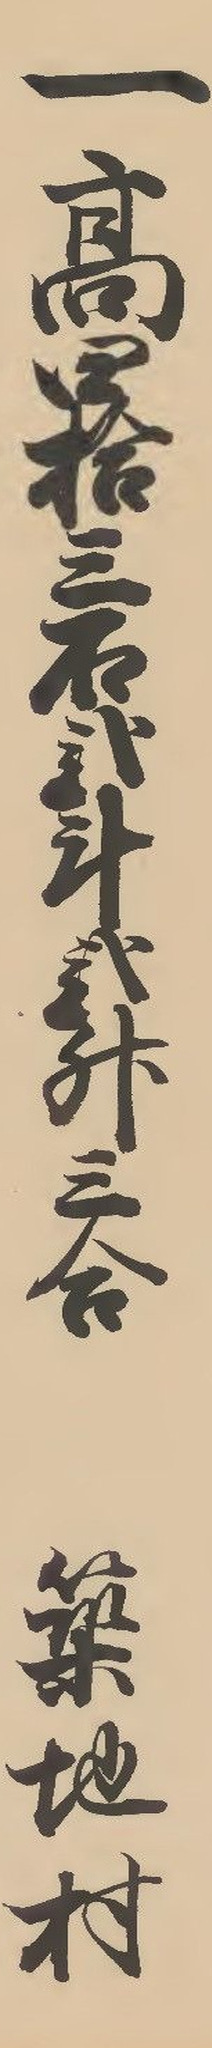一髙四拾三石弐斗弐升三合築地村
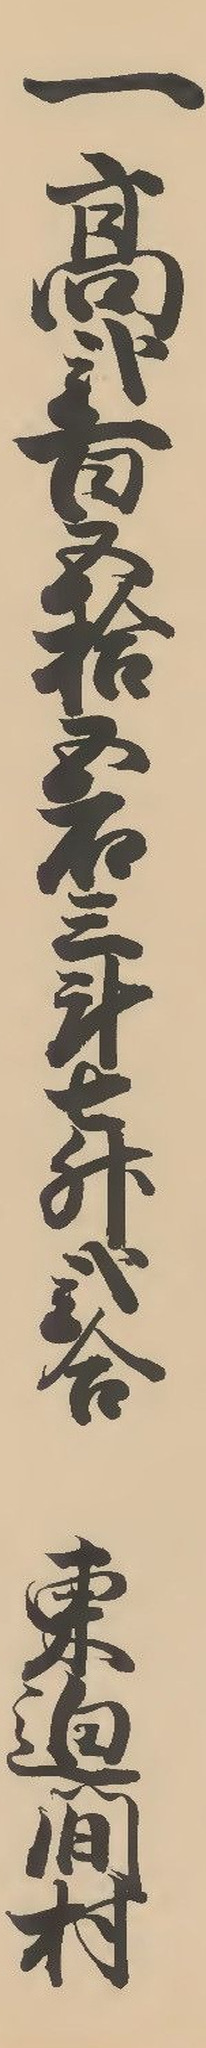一髙弐百五拾五石三斗七升弐合東迫間村
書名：肥後国郷帳
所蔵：国立公文書館 National Archives of Japan
